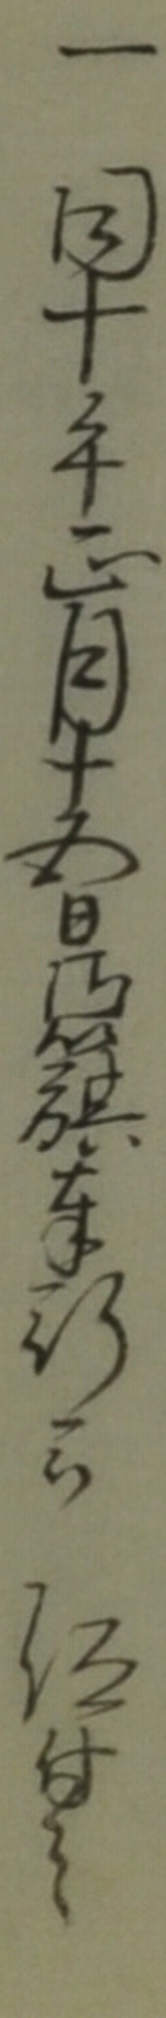一同十午正月十五日御籏奉行被仰付之
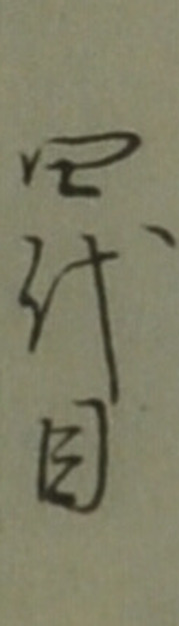四代目
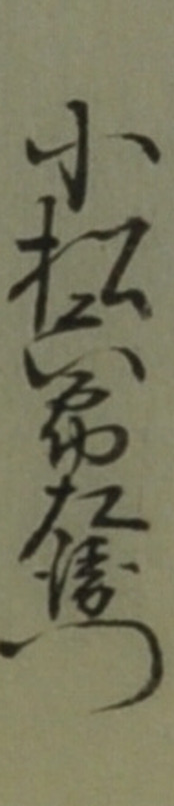小松六郎左衛門
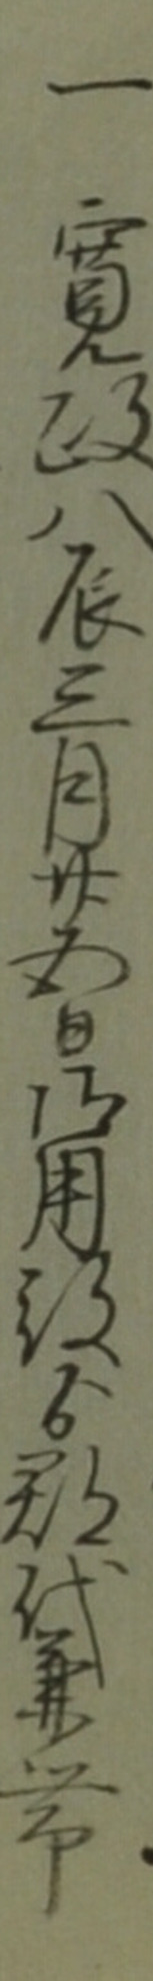一寛政八辰三月廿五日御用役ゟｇ郡代兼帯
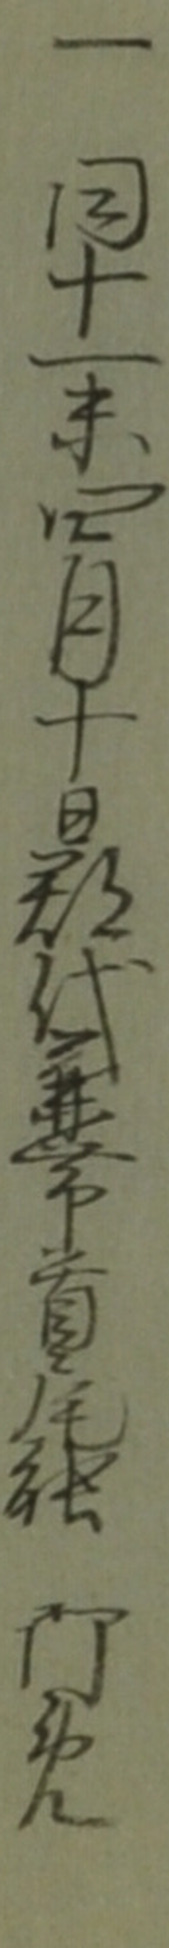一同十一未四月十日郡代兼帯首尾能御免
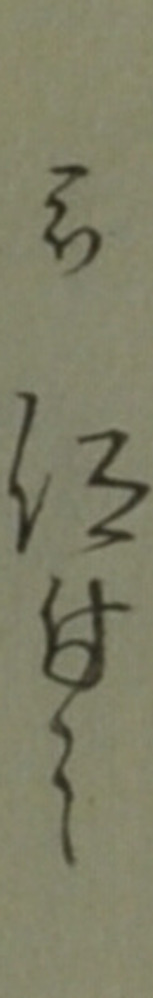被仰付之
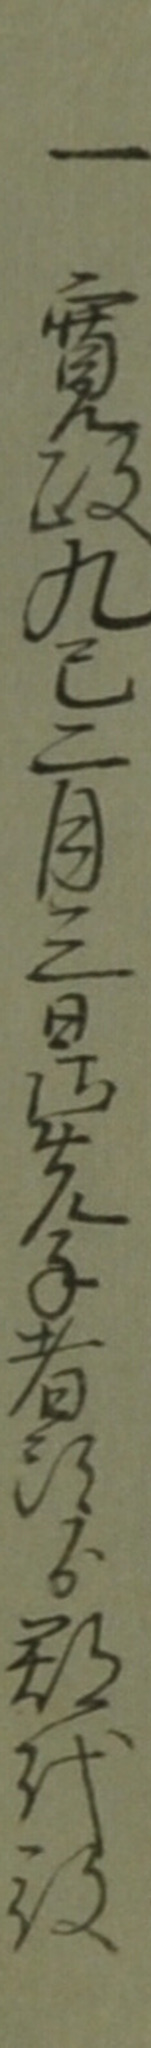一寛政九巳二月三日御先手者頭ゟ郡代役
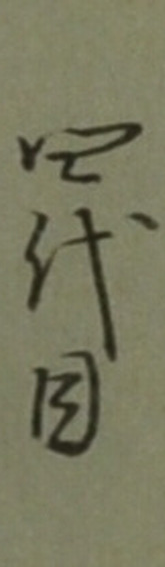四代目
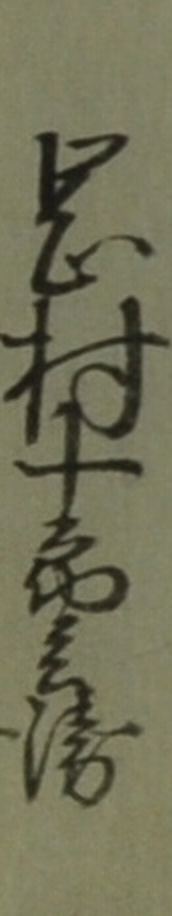岡村十郎兵衛
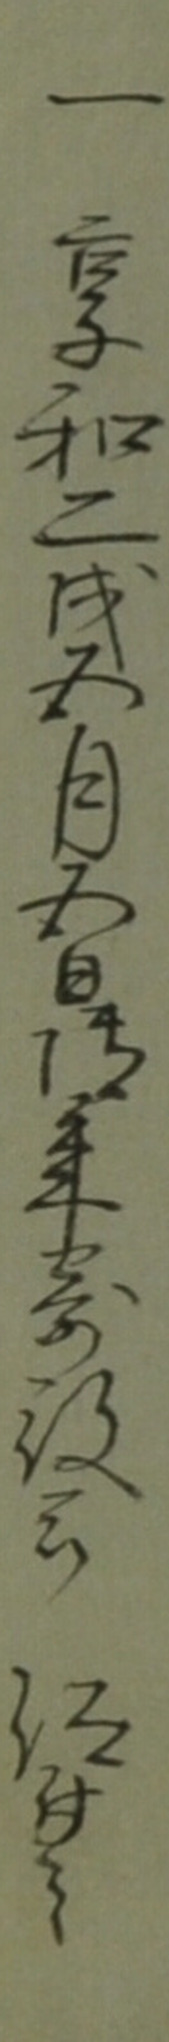一享和二戌五月五日御年寄役被仰付之
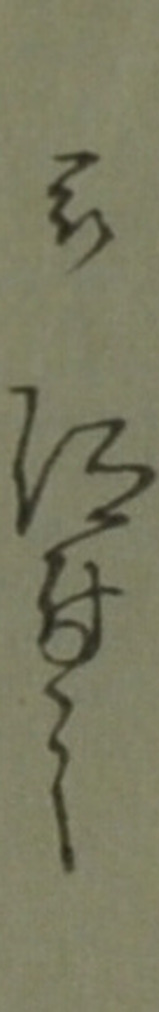被仰付之
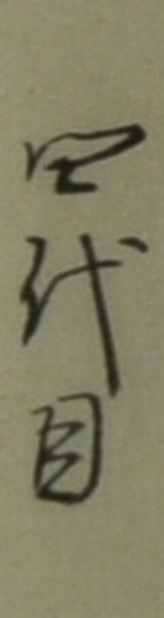四代目

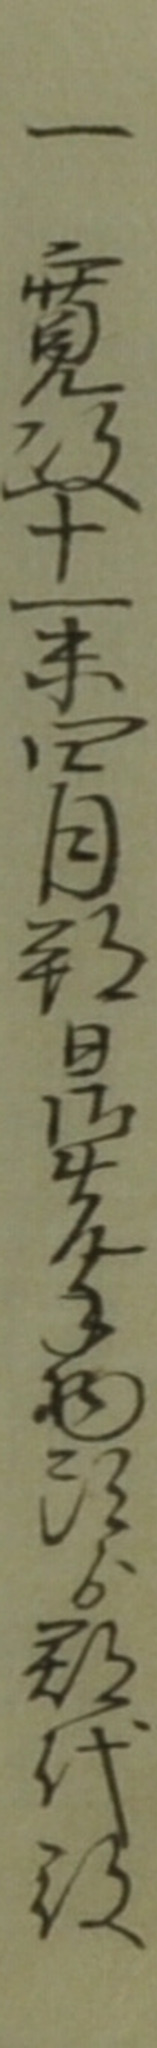一寛政十一未四月朔日御先手物頭ゟ郡代役
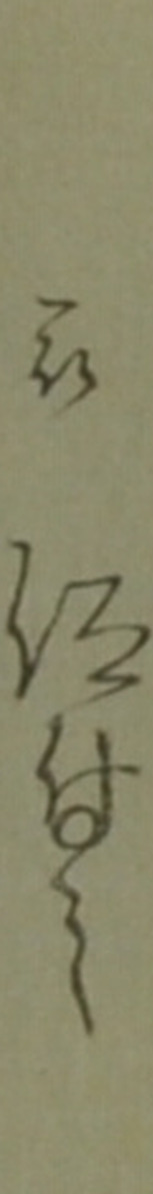被仰付之
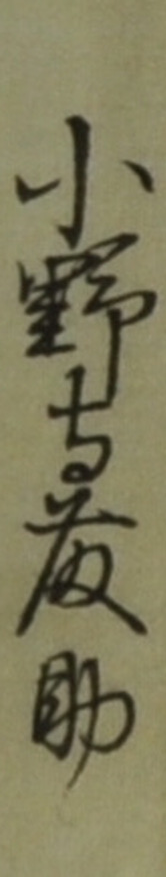小野寺藤助
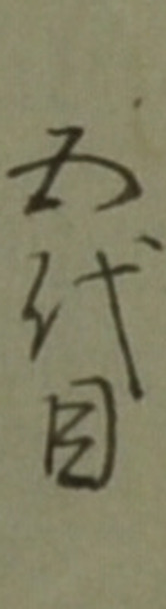三代目
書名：諸御役代々録（二）
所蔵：伊那市立高遠町図書館・合同会社AMANE
